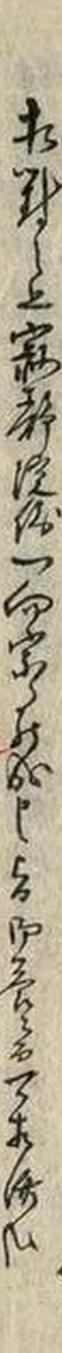相対之上寂静院儀一向宗へ罷成申候旨御答にて可相済哉
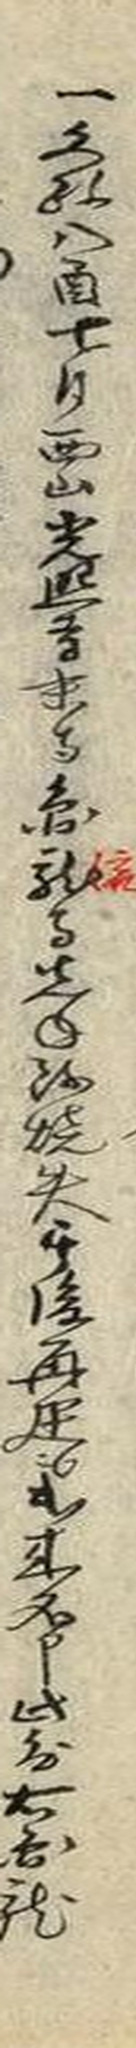一文政八酉七月西山光照寺末寺円龍寺先年致焼失其後再建も出来不申此度右円龍
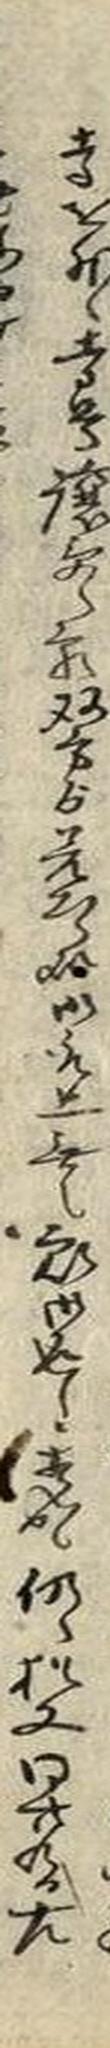寺を外へ寺号譲受之願双方ゟ差出候処御取上無之願御返しに相成候仍之猶又同廿九日左
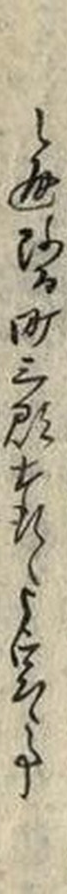之通改て町三郡奉行へ被仰出候事
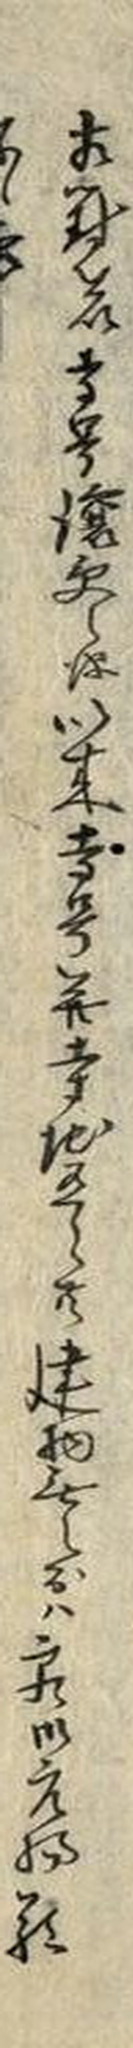相対を以寺号譲受之儀以来寺号并寺地有之共建物無之分は願御取揚難
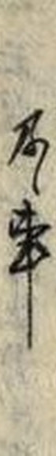及候事

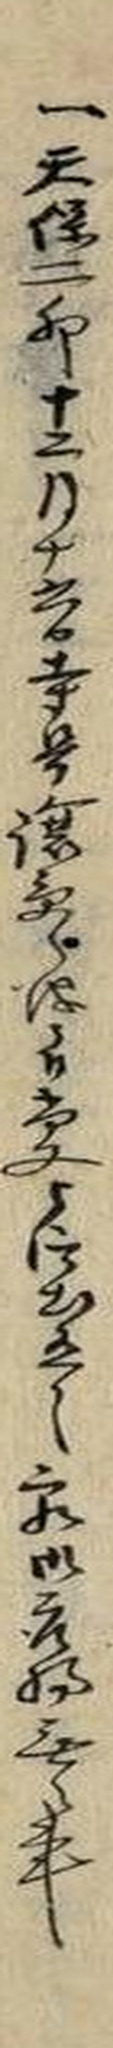一天保二卯十二月十六日寺号譲受之儀に付尚又被仰出有之願御取揚無之事
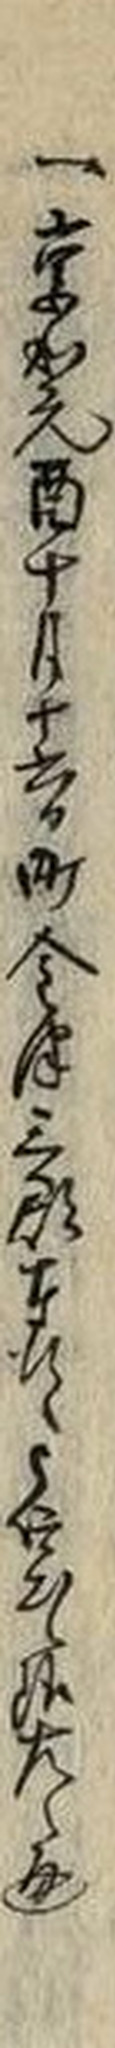一享和元酉十月十六日町金津三郡奉行へ被仰出候趣左之通
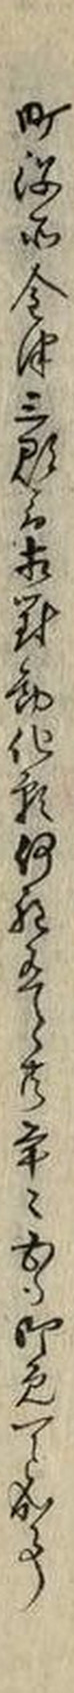町役所金津三郡にて相対勧化願何程有之候共年々五ツ御免可被成事
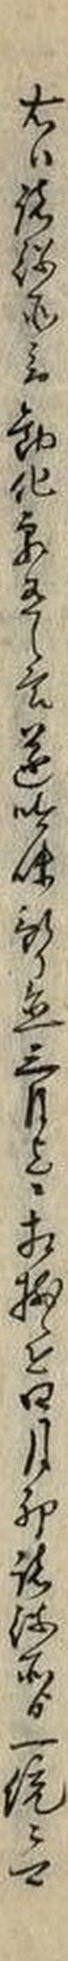右は諸役所にて勧化願有之節遂吟味預り置三月迄に相揃候を四月初諸役所ゟ一統に可
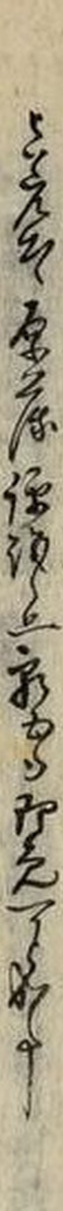被差出候厚薄評議之上願五ツ御免可被成事
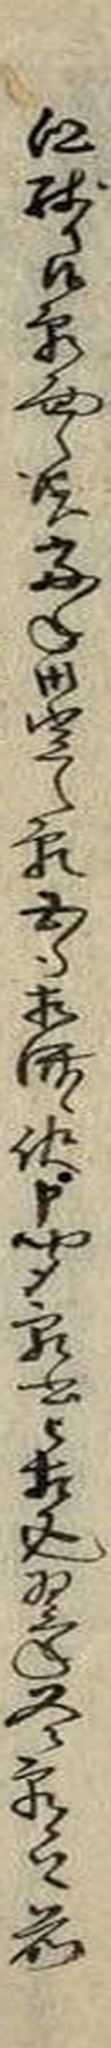但残り候願面之儀は当年御定之願五ツ相済候訳申聞願出被相返翌年又々願候はゝ前
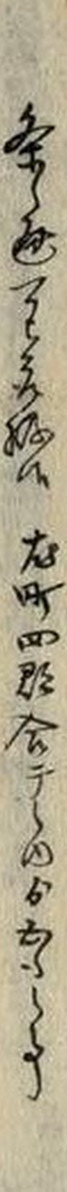条之通可被取扱候尤町四郡合テ之内ゟ五ツ之事
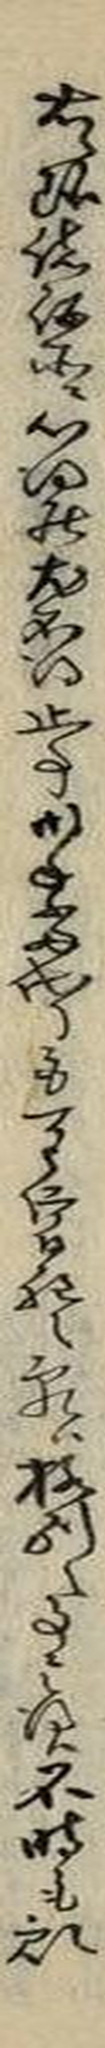右之趣諸役所に心得居尤不得止事御手当代りにも可被仰付程之願は格別之事に候得は不時にも願
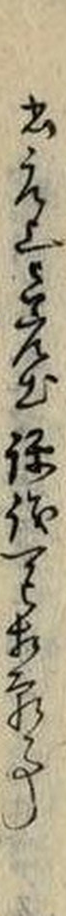書取上被差出評議可被相願候事
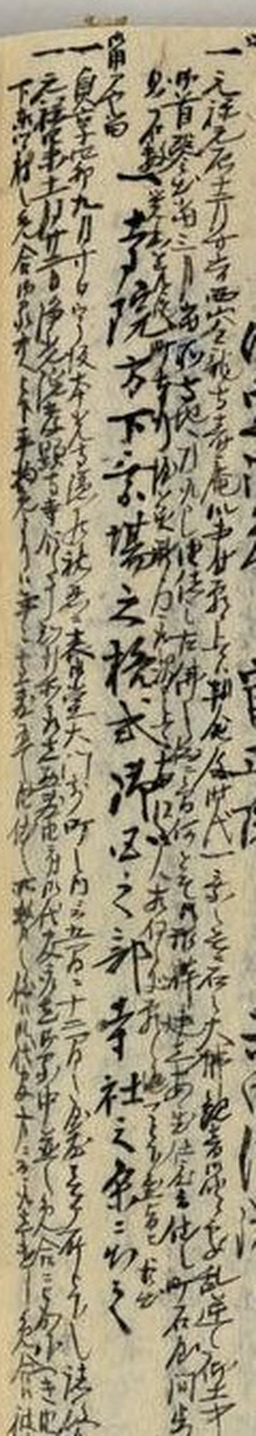一寺院方下乗場之格式御国之部寺社之条に出之
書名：御城下諸事之部
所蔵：福井県文書館 Fukui Prefectural Archives
